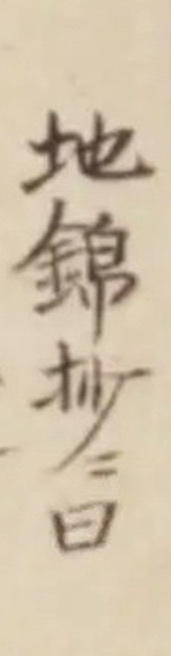地錦抄に曰
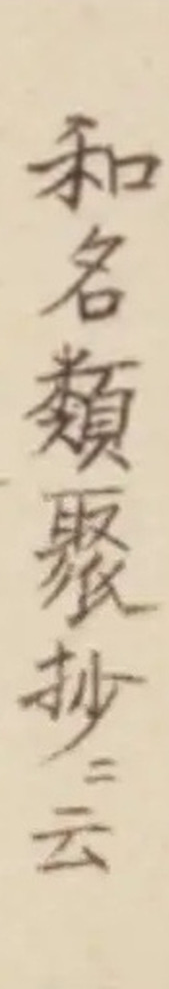和名類聚抄ニ云
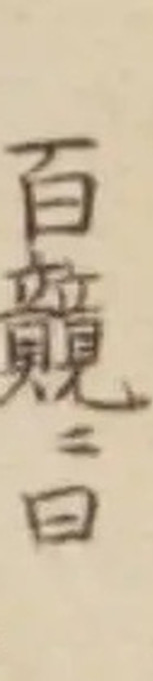百競に曰
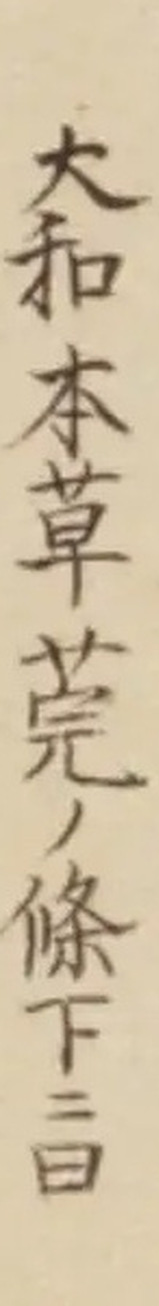大和本草莞の條下ニ曰
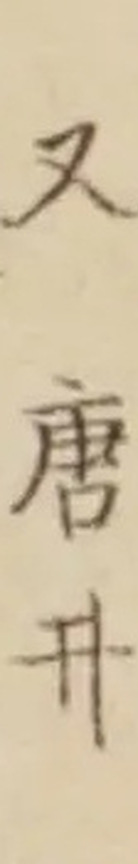又唐井
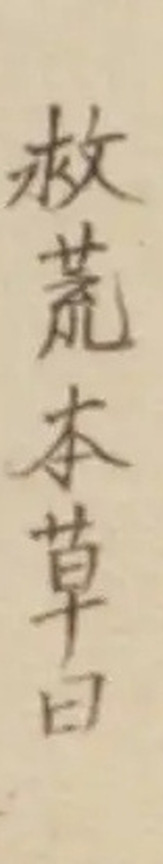救荒本草曰
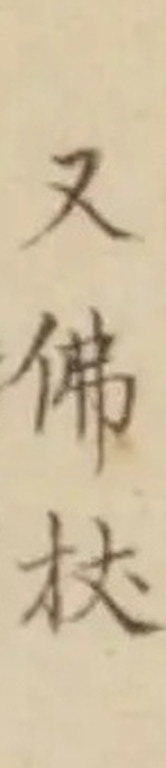又佛杖
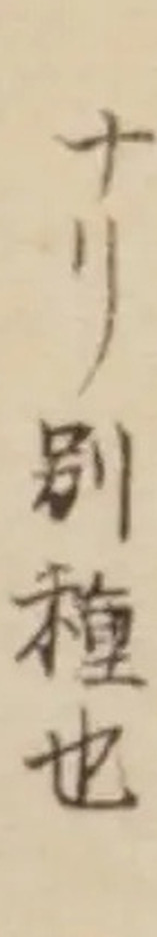なり別種也

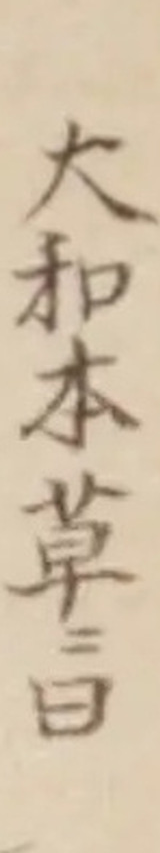大和本草に曰
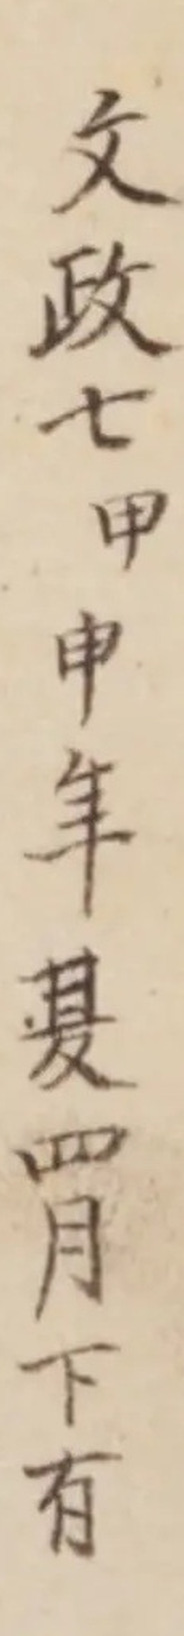文政甲申年夏四月下有
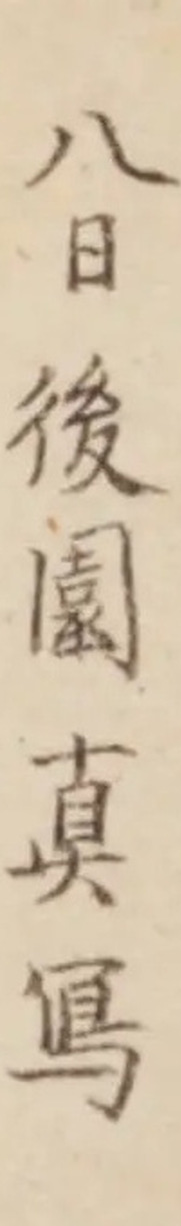八日後園真寫
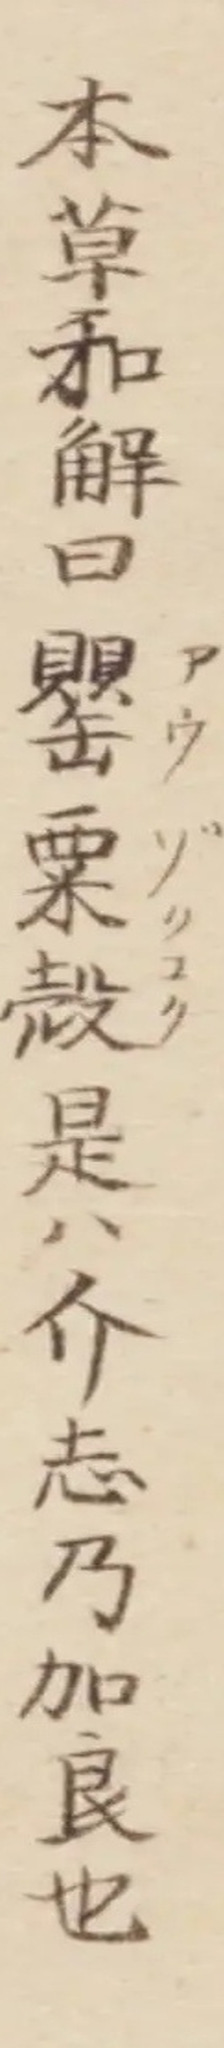本草和解曰罌粟穀是は介志乃加良也
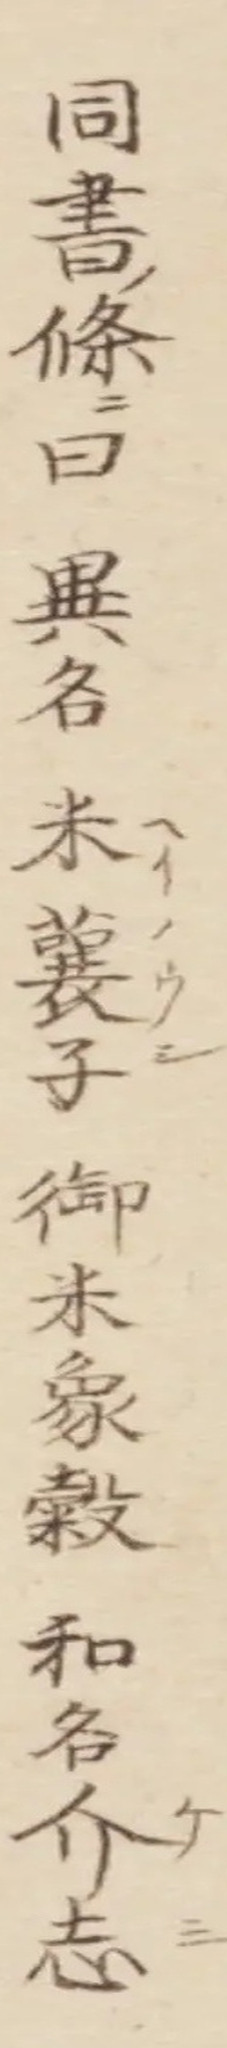同書の條に曰異名米蓑子御米象穀和名介志
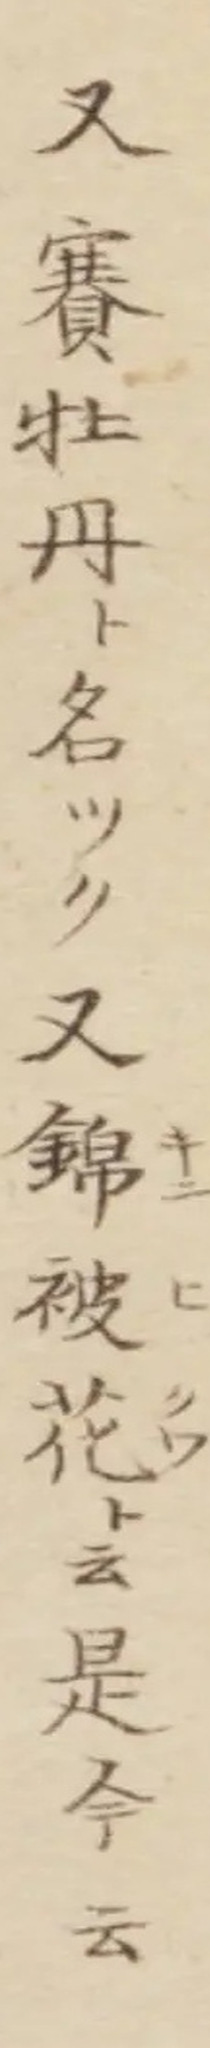又賽銭牡丹と名つく錦被花と云是今云
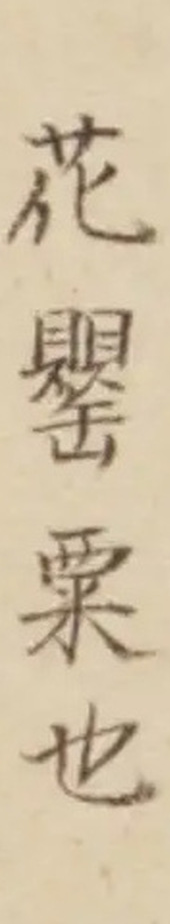花罌栗也

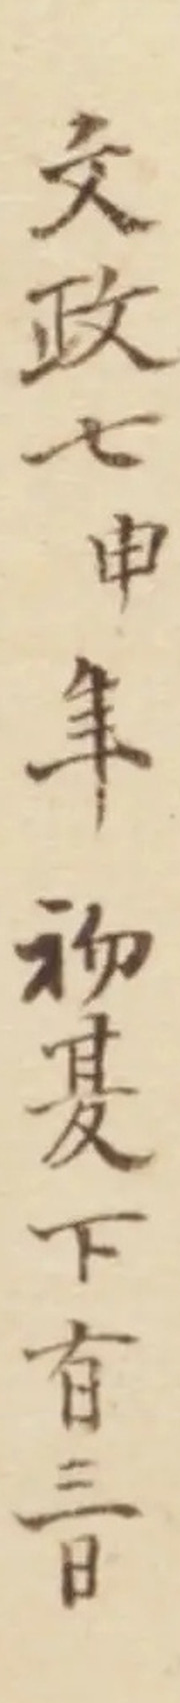文政七申年初夏下有三日
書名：梅園草木花譜夏之部. 2
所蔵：国立国会図書館 National Diet Library, JAPAN
